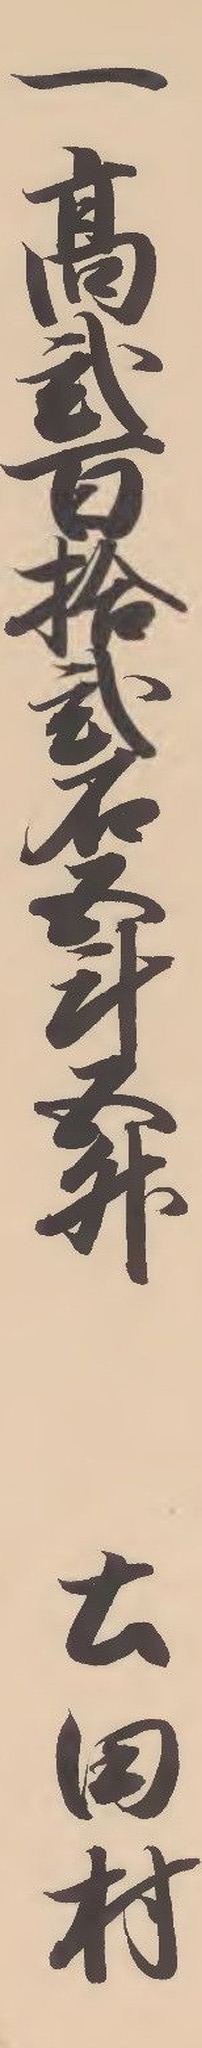一高弐百拾弐石五斗五升土田村
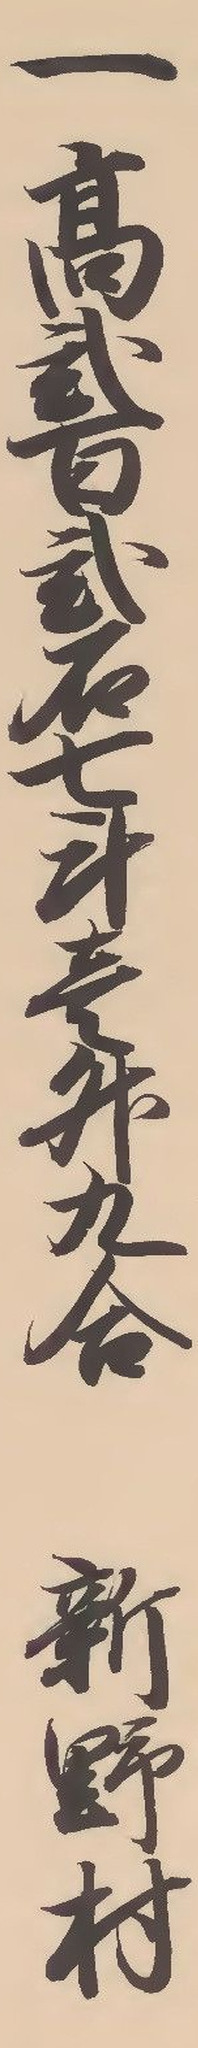一高弐百弐石七斗壱升九合新野村
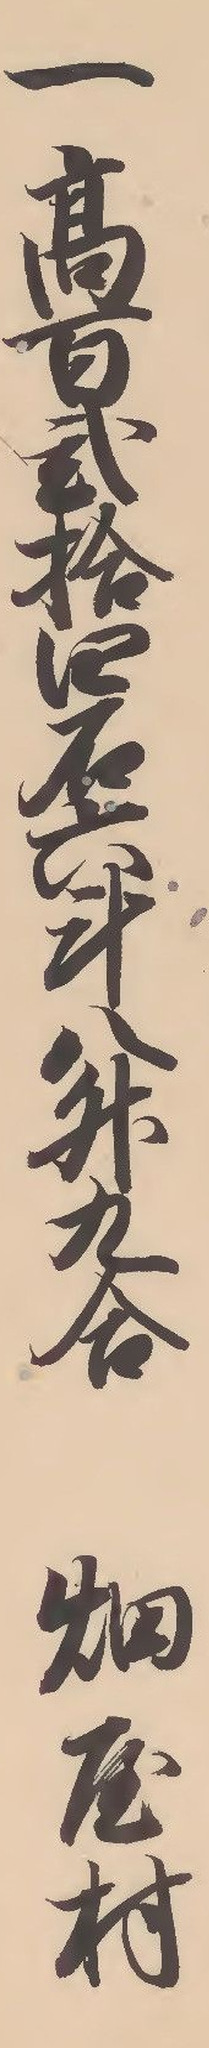一高百弐拾四石六斗八升九合畑屋村

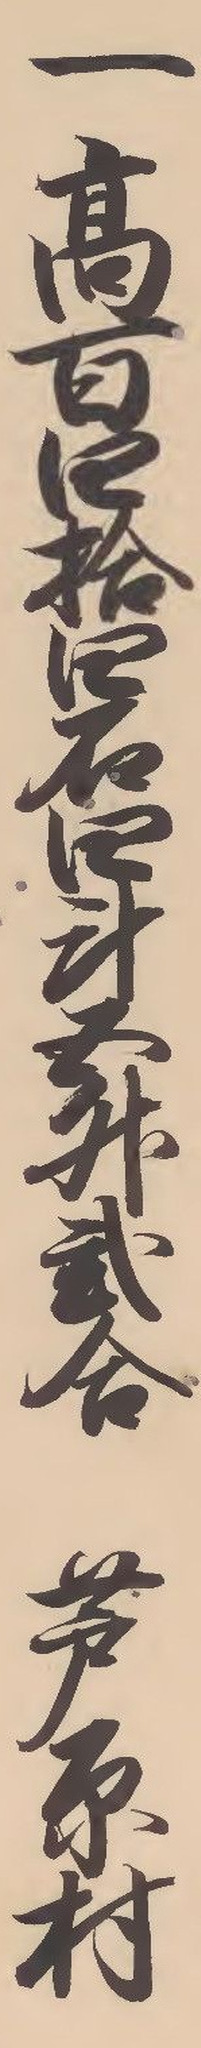一高百四拾四石四斗五升弐合芦原村
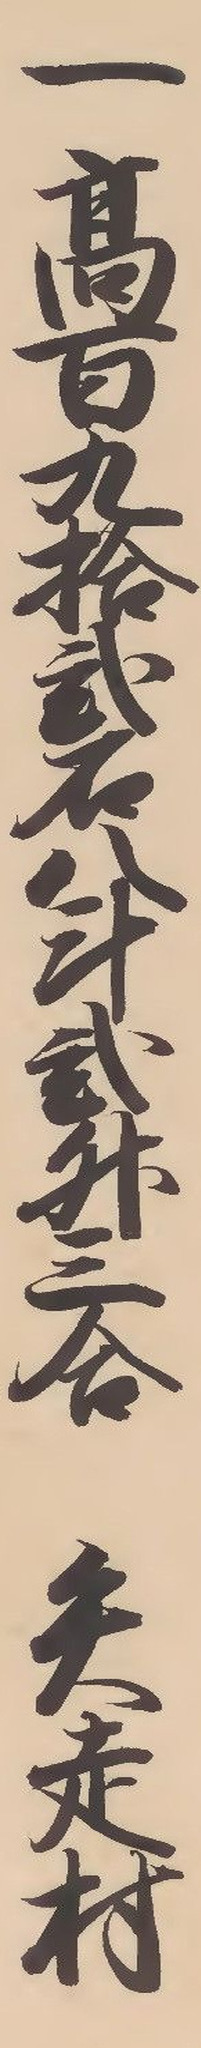一高百九拾弐石八斗弐升三合矢走村
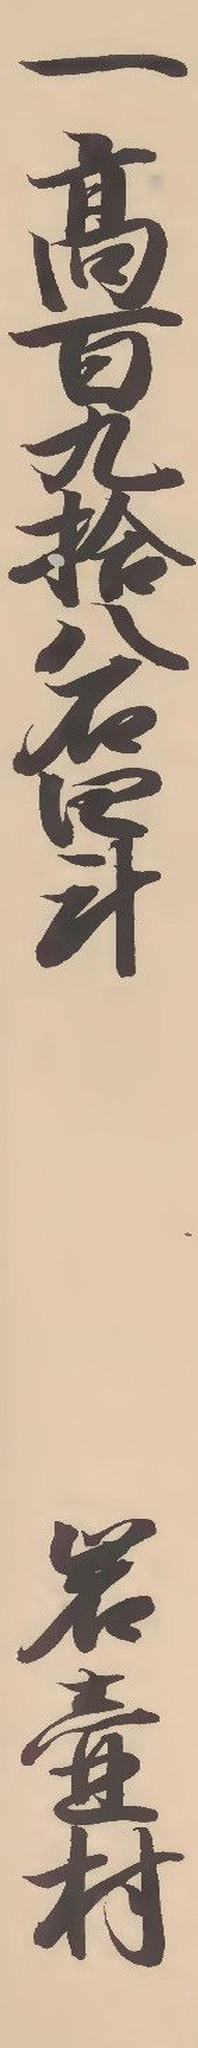一高百九拾八石四斗岩壺村
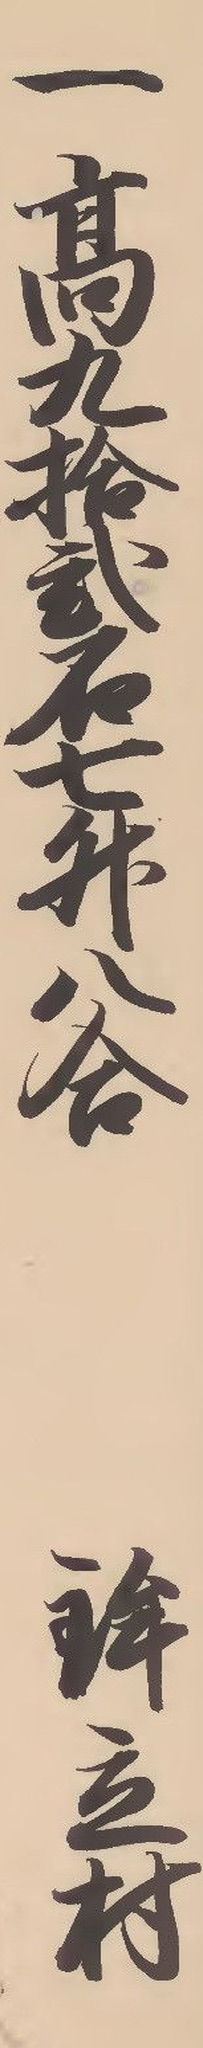一高九拾弐石七升八合鉾立村
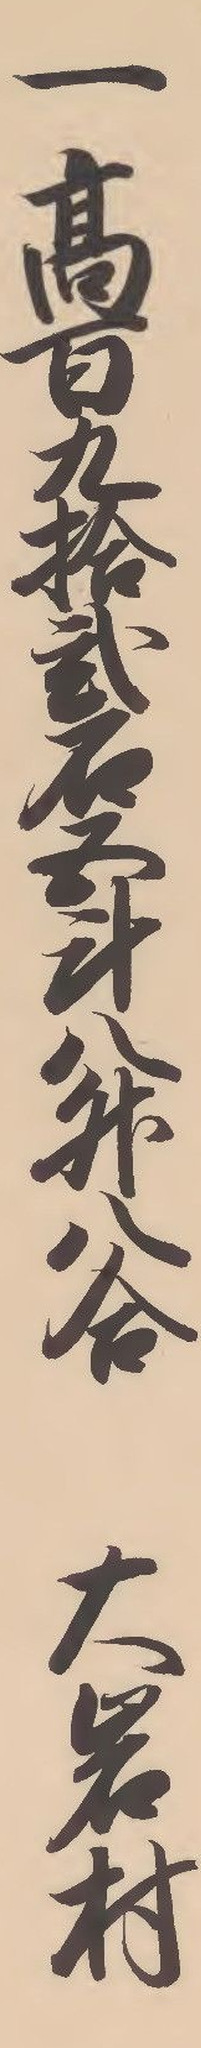一高百九拾弐石五斗八升八合大岩村
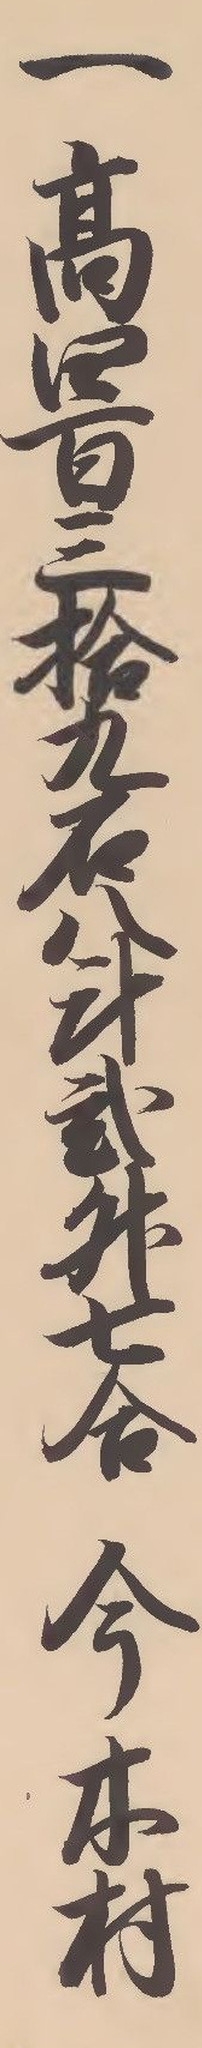一高四百三拾九石八斗弐升七合今木村
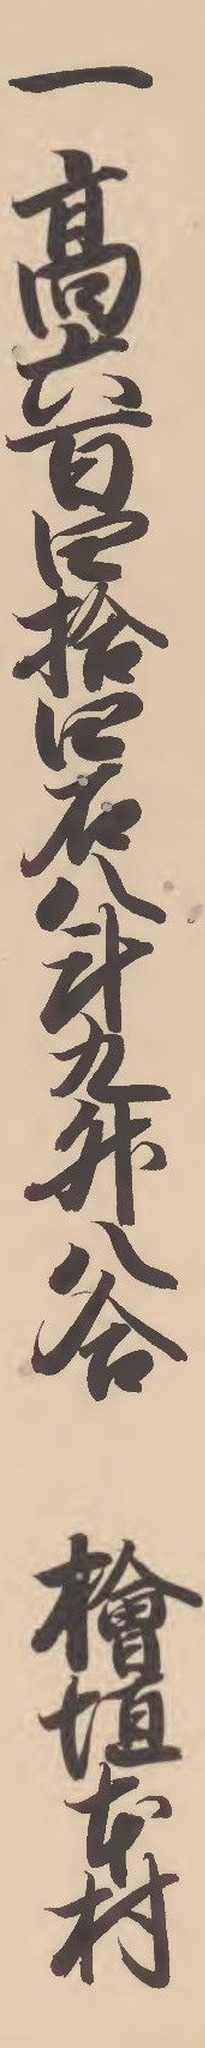一高六百四拾四石八斗九升八合桧垣本村

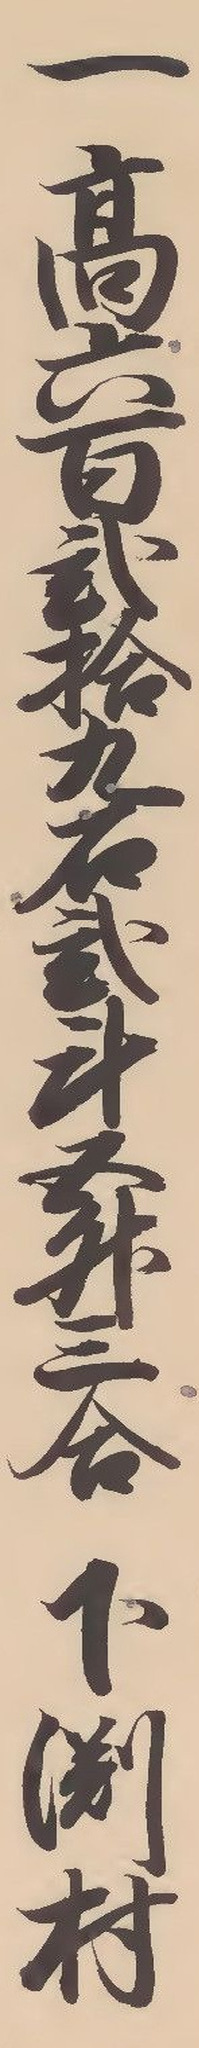一高六百弐拾九石弐斗五升三合下渕村
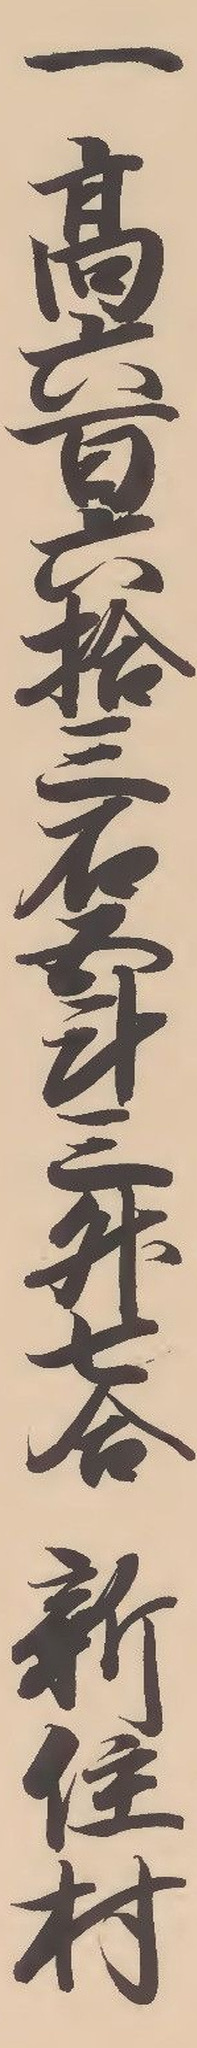一高六百六拾三石五斗三升七合新住村
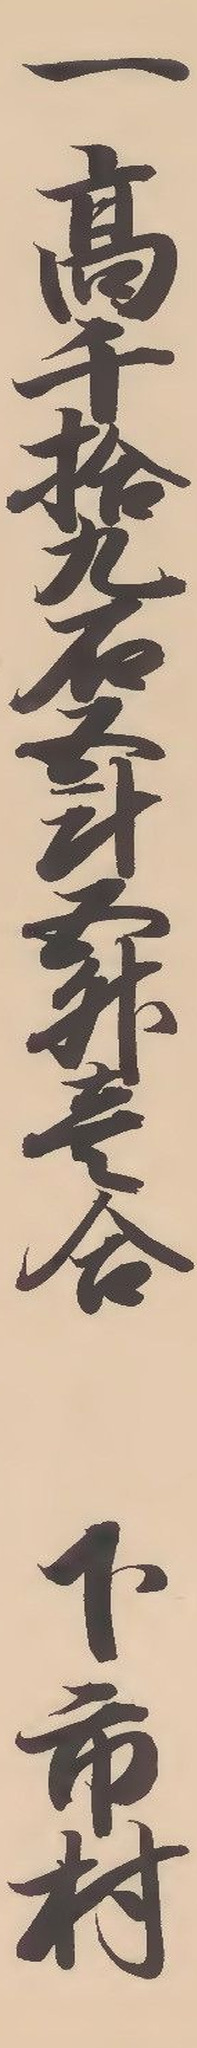一高千拾九石五斗五升壱合下市村
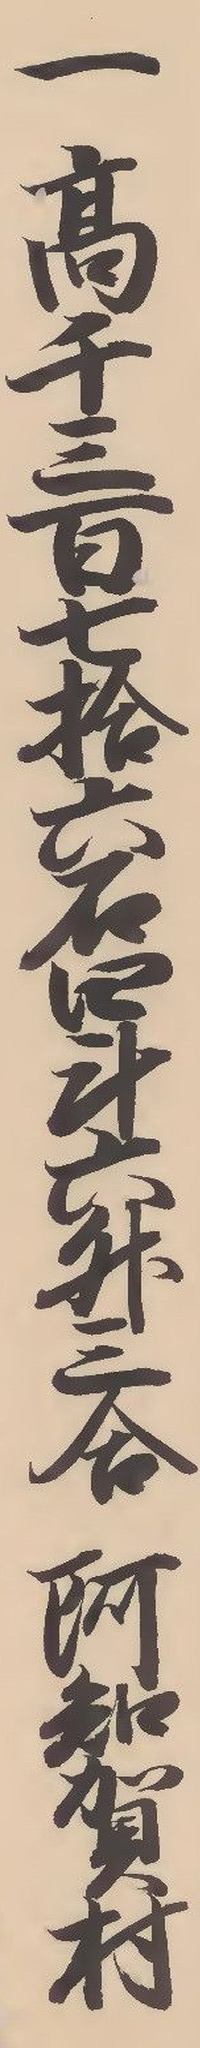一高千三百七拾六石四斗六升三合阿知賀村
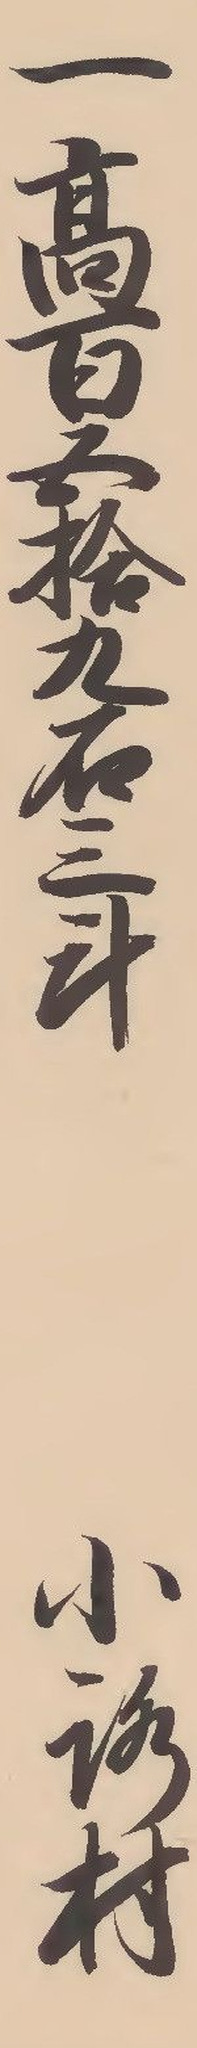一高百五拾九石三斗小路村
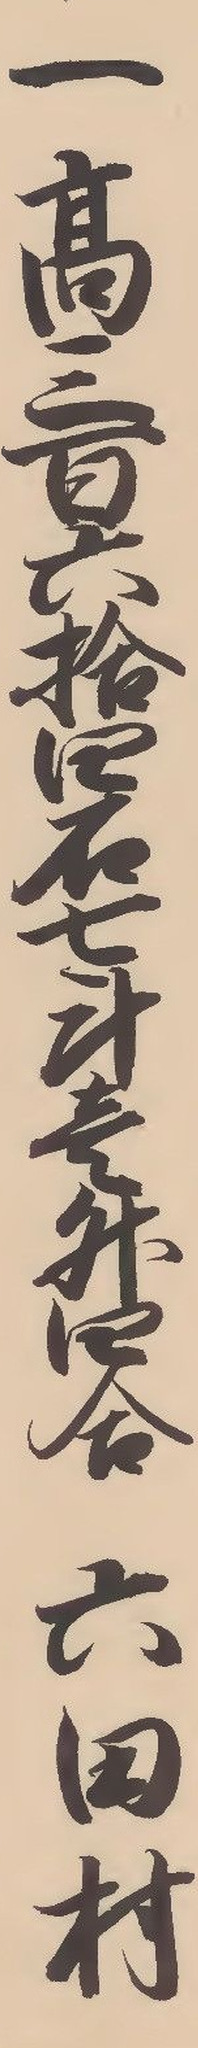一高三百六拾四石七斗壱升四合六田村
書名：大和国郷帳
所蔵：国立公文書館 National Archives of Japan
